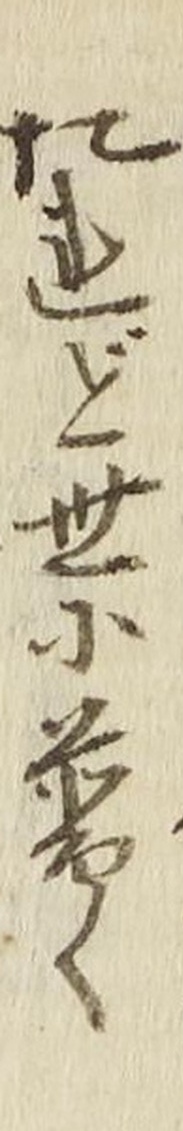たれど世に普く
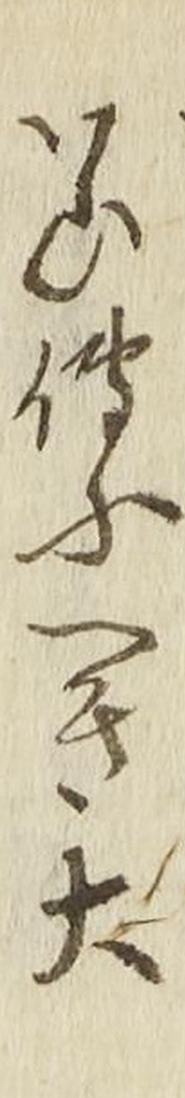いひ伝ふへき大
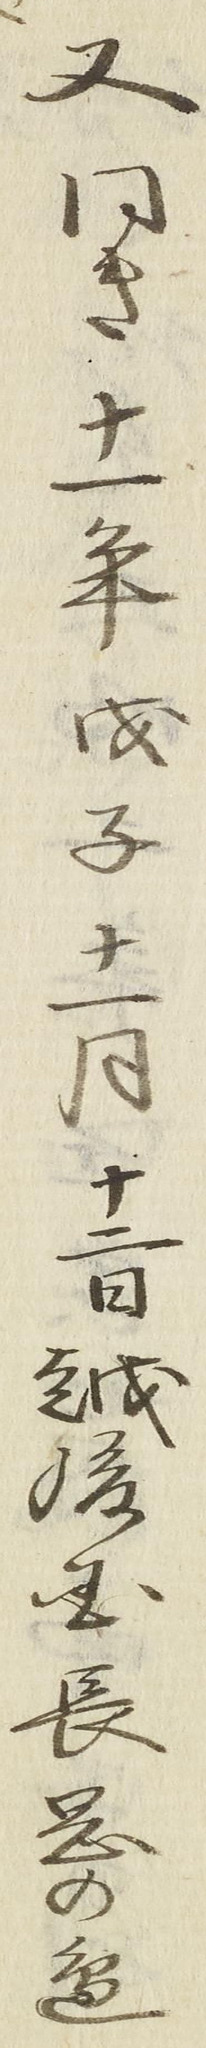又同き十一年戊子十一月十二日越後国長岡の辺
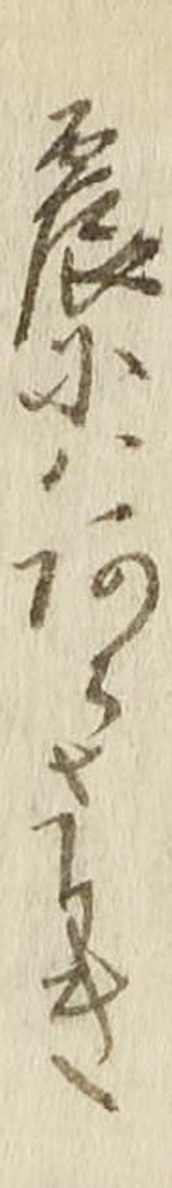震にはあらさりき
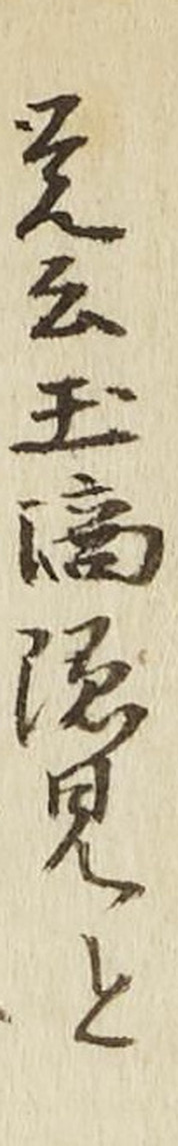覚云玉滴隠見と
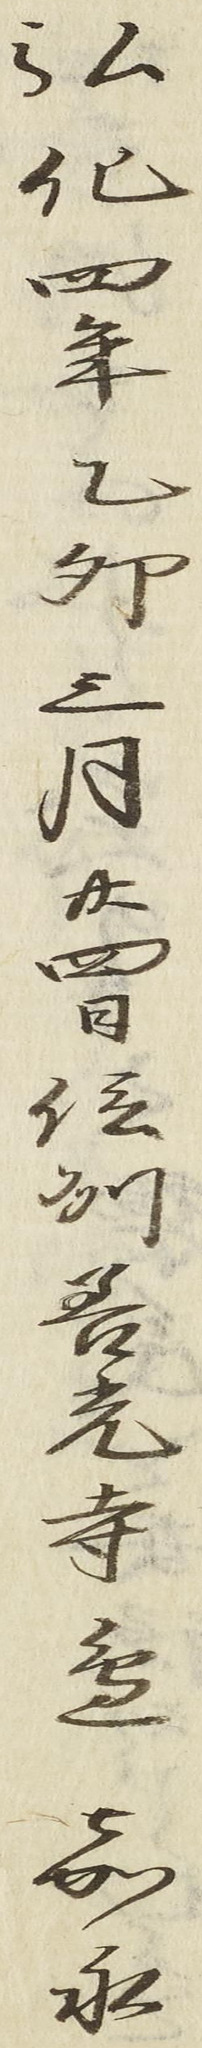弘化四年乙夘三月廿四日信州善光寺辺嘉永
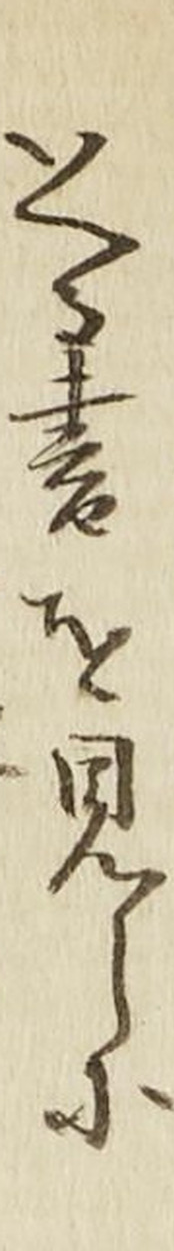いへる書を見しに
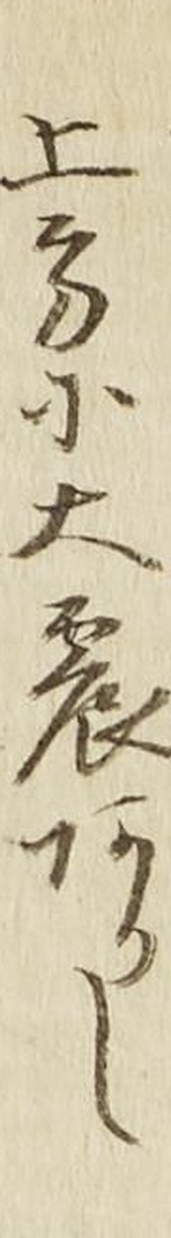上方に大震ありし
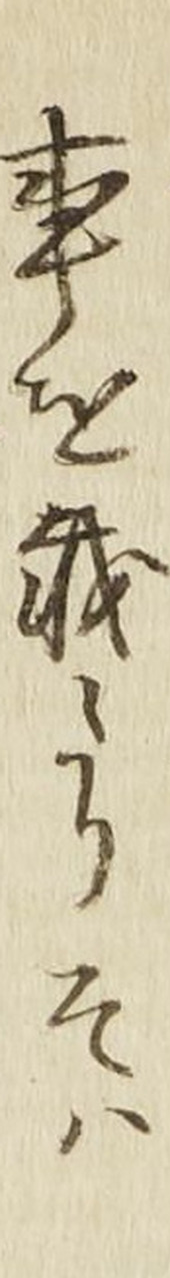事を載たりそは
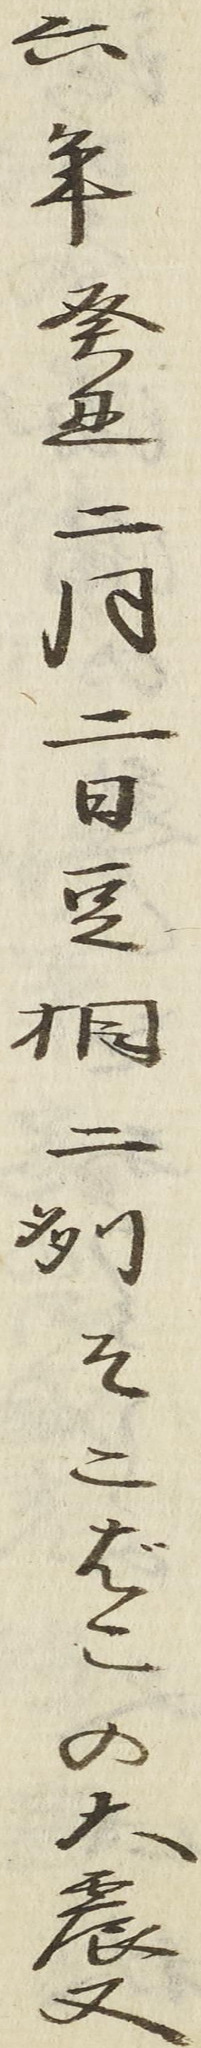六年癸丑二月二日豆相二州そこばこの大震又
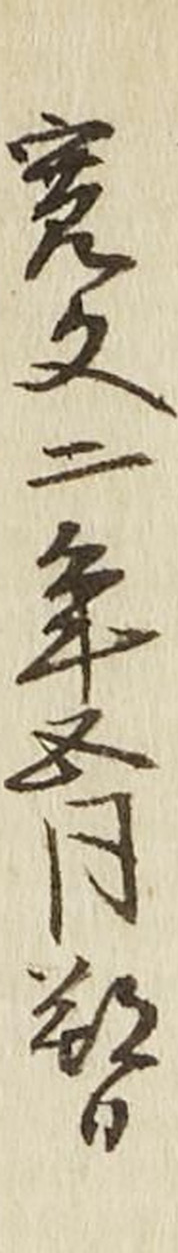寛文二年五月昨日
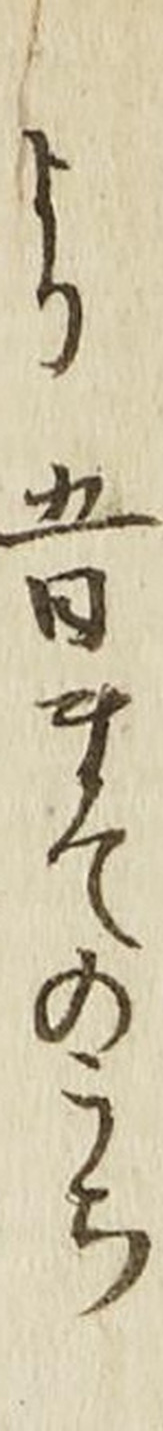より五日まてのうち
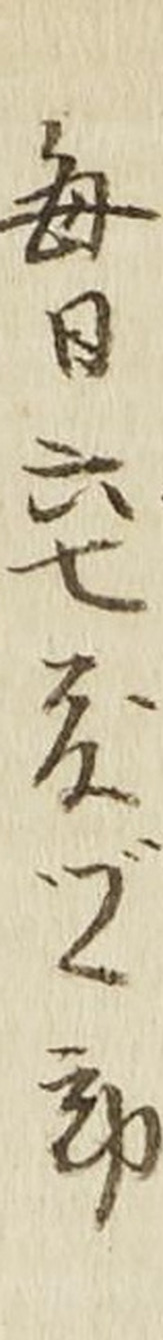毎日六七度づゝ動
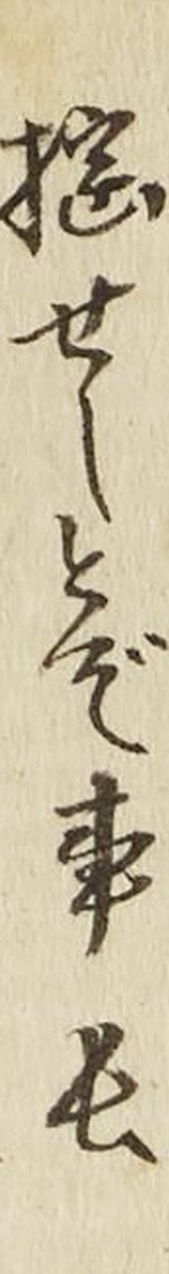揺せしとぞ事長
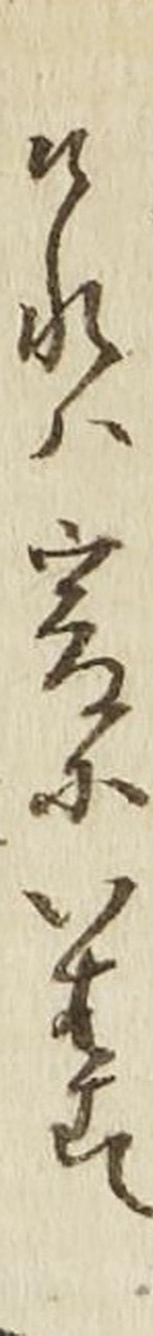けれは爰にいはす
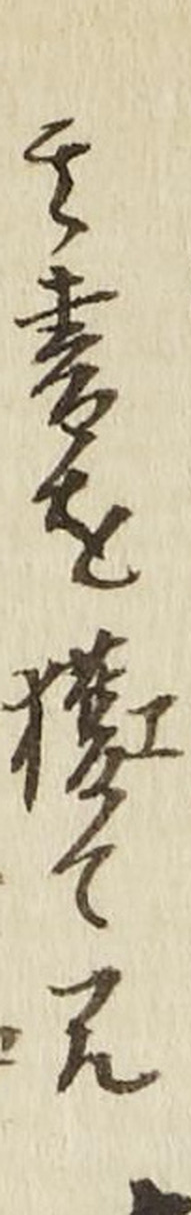其書を獲て見
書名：やぶれ窓の記　全
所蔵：東京大学地震研究所図書室 Earthquake Research Institute Library, The University of Tokyo, JAPAN
